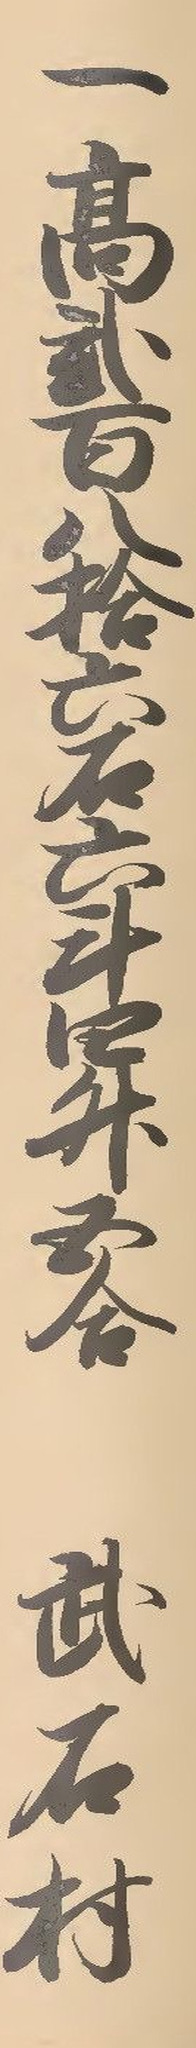一高弐百八拾六石六斗四升五合武石村
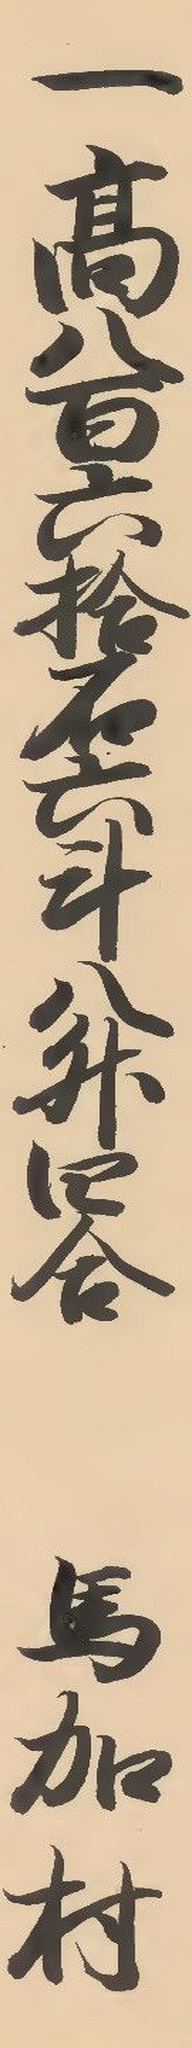一高八百六拾石六斗八升四合馬加村
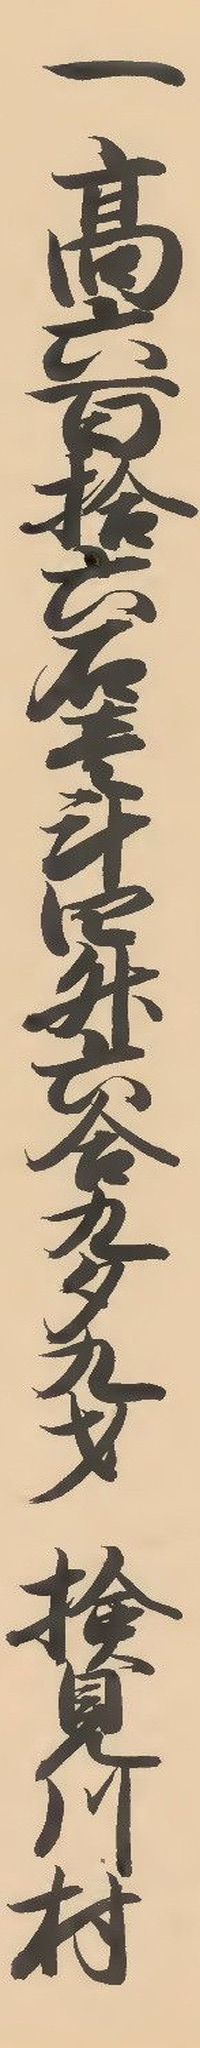一高六百拾六石壱斗四升六合九勺九才検見川村
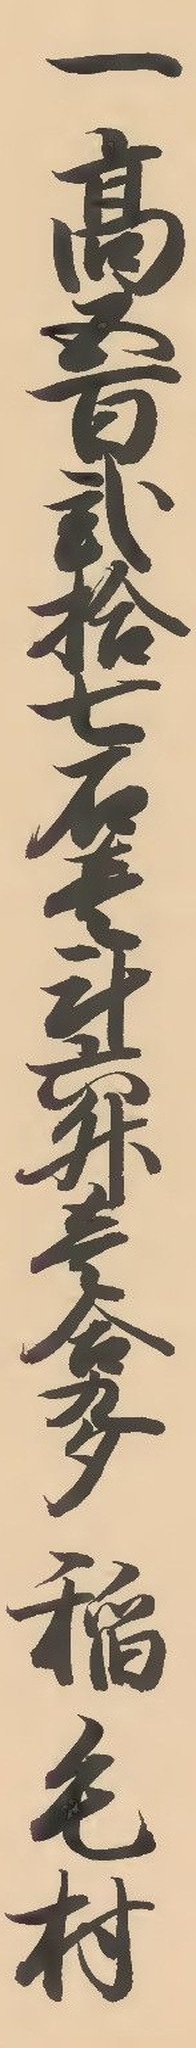一高五百弐拾七石壱斗六升壱合九勺稲毛村

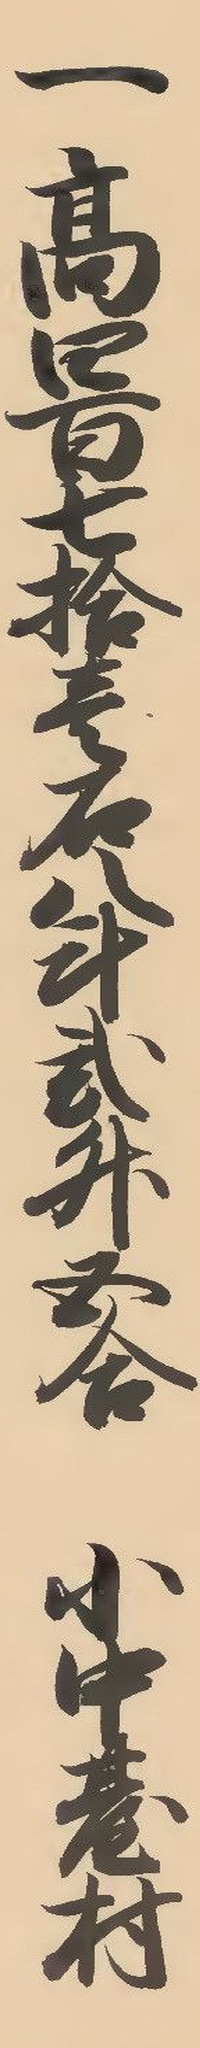一高四百七拾壱石八斗弐升五合小中台村
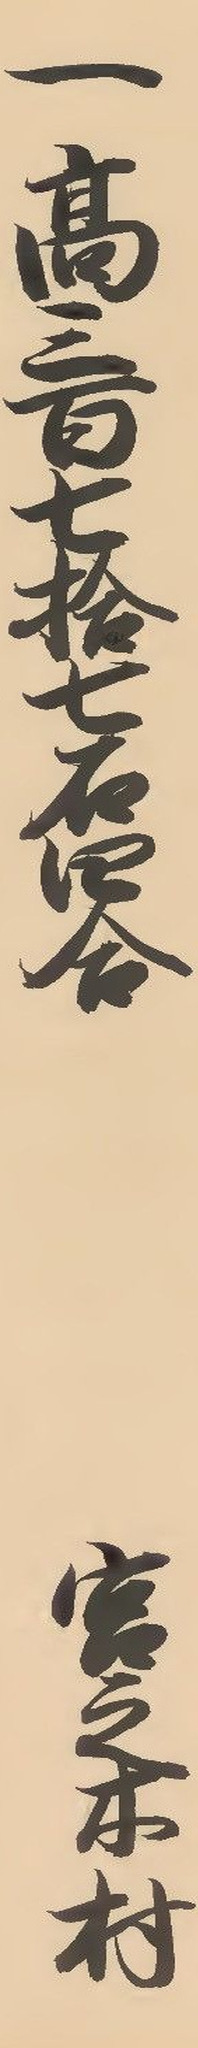一高三百七拾七石四合宮之木村
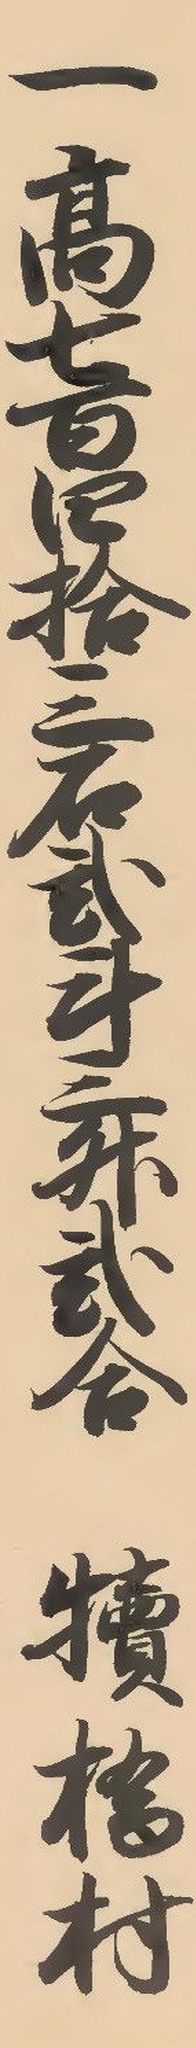一高七百四拾三石弐斗三升弐合犢橋村
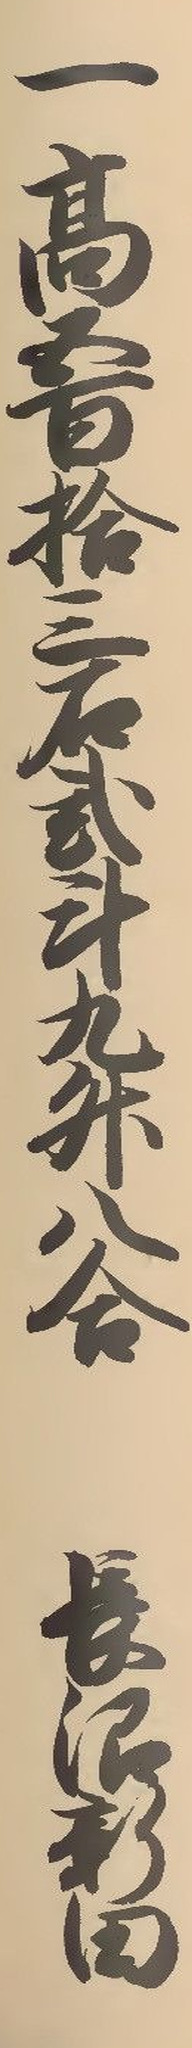一高五百拾三石弐斗九升八合長沼新田
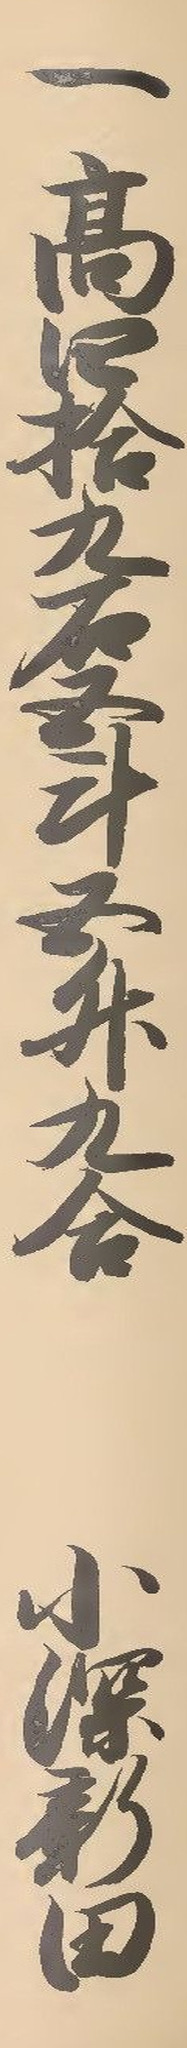一高四拾九石五斗五升九合小深新田
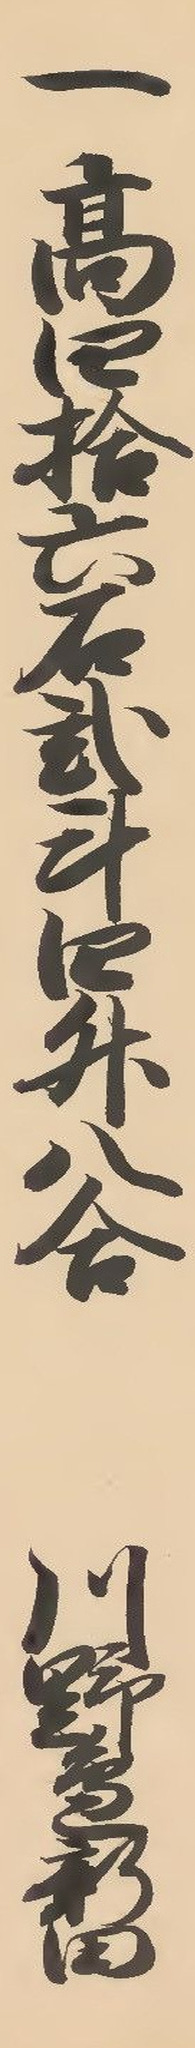一高四拾六石弐斗四升八合川野辺新田
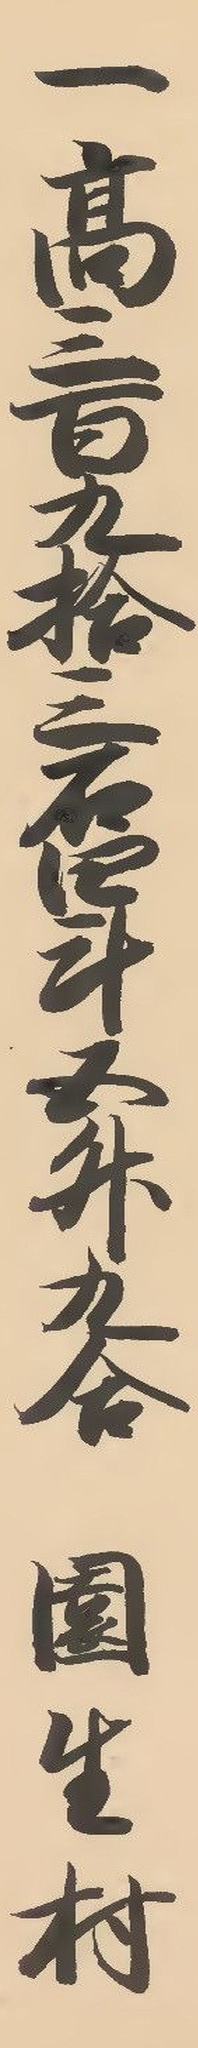一高三百九拾三石四斗五升九合園生村
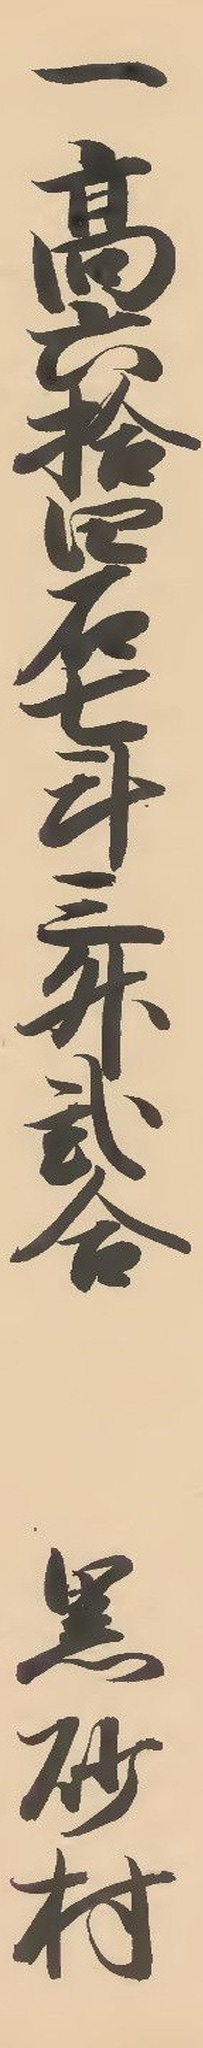一高六拾四石七斗三升弐合黒砂村

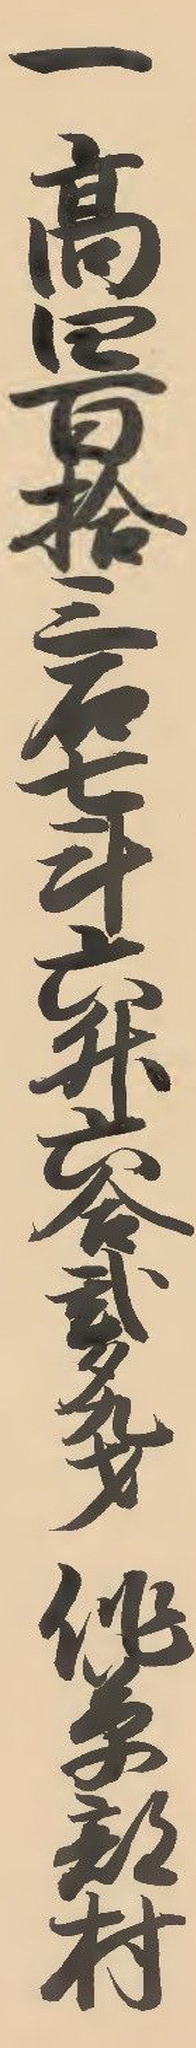一高四百拾三石七斗六升六合弐勺九才作草部村
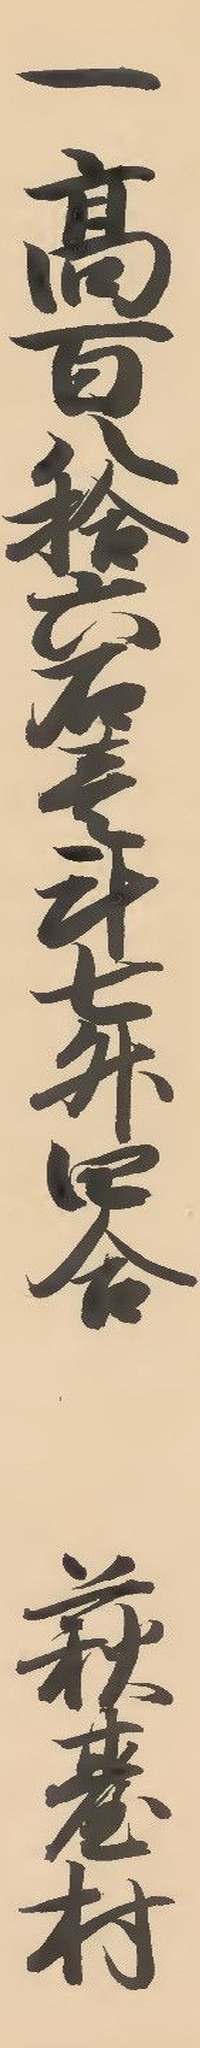一高百八拾六石壱斗七升四合萩台村
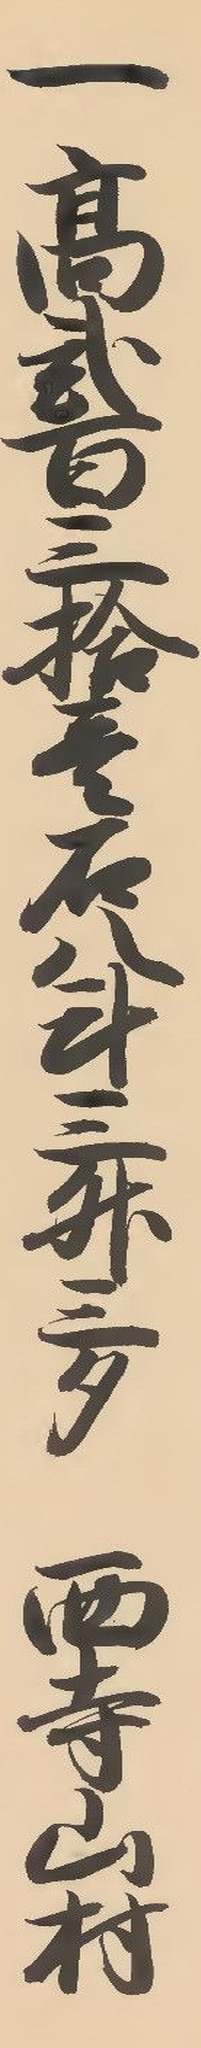一高弐百三拾壱石八斗三升三勺西寺山村
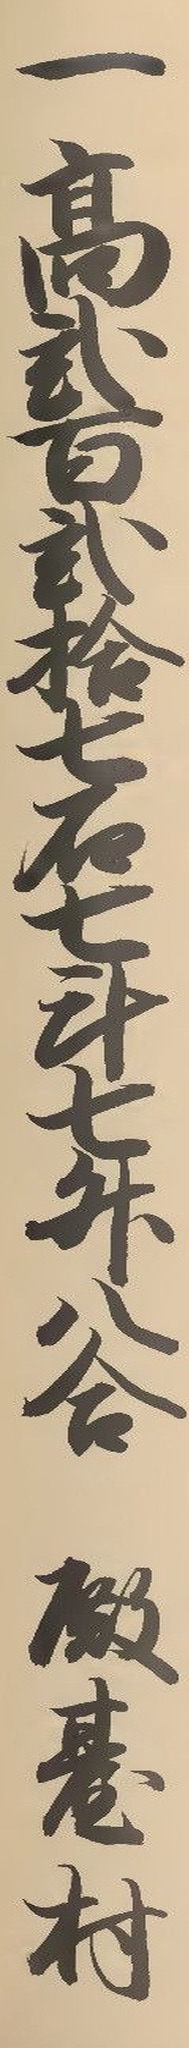一高弐百弐拾七石七斗七升八合殿台村
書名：下総国郷帳
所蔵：国立公文書館 National Archives of Japan
